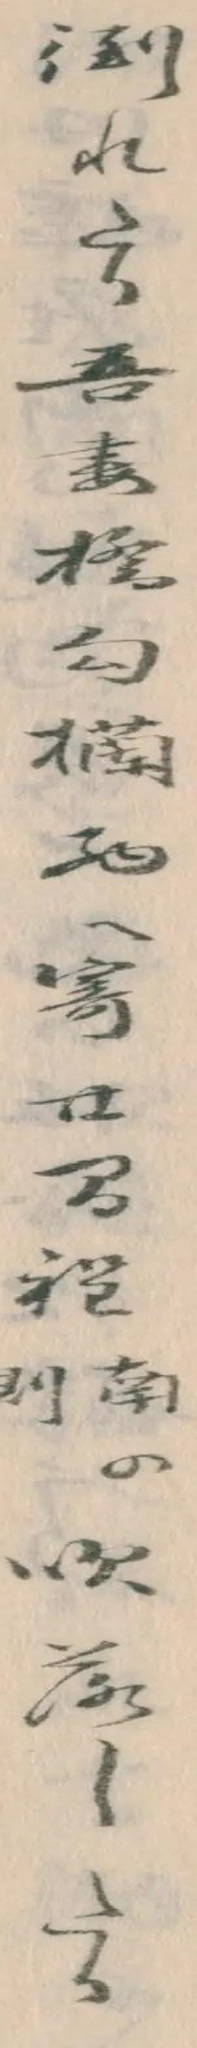倒れたり吾妻橋勾欄西へ寄廿間程南の側吹落したり
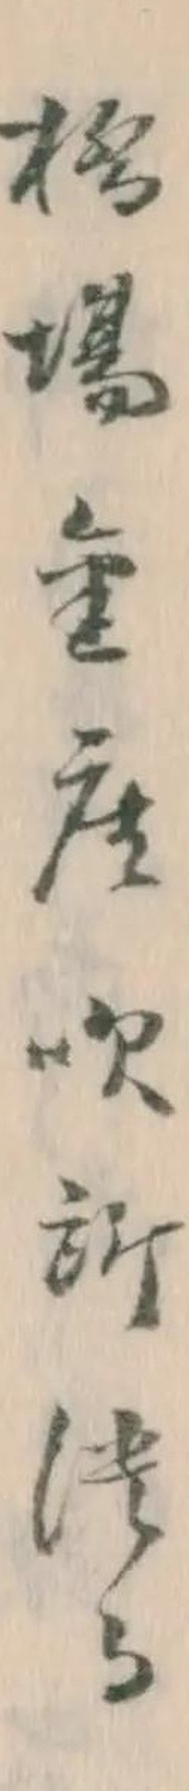橋場金座吹所潰る
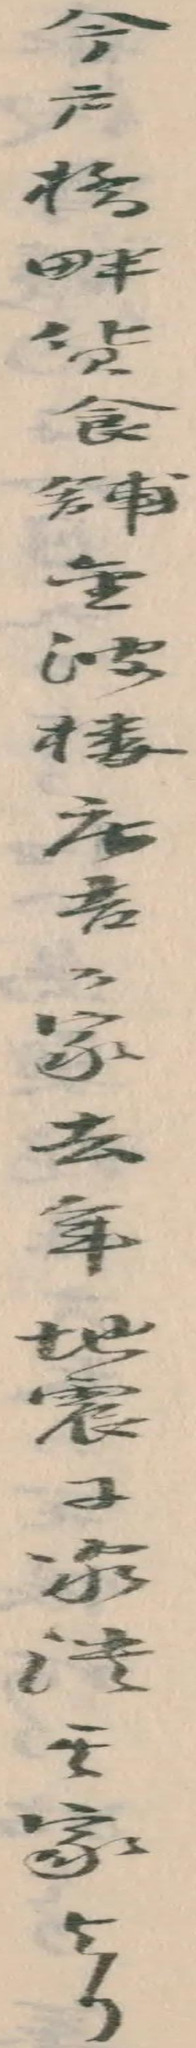今戸橋畔貨食舗金波楼庄吉か家去年地震に家潰其家より
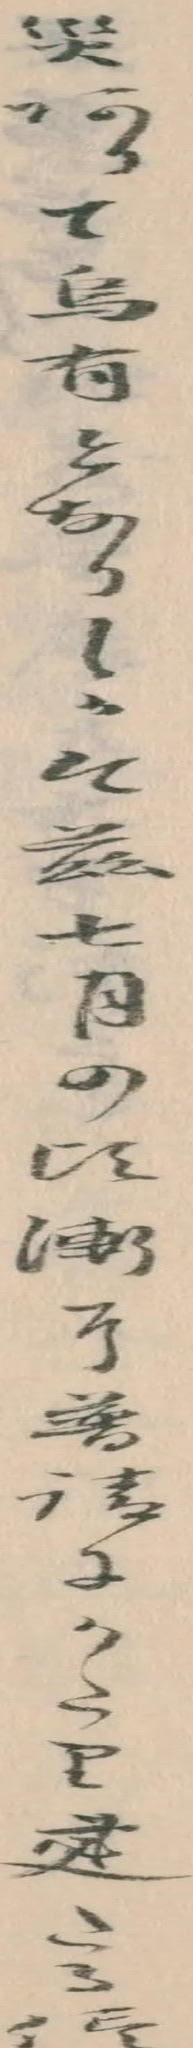災ありて烏有となりしか今茲七月の頃漸に普請にかたり建たる侭
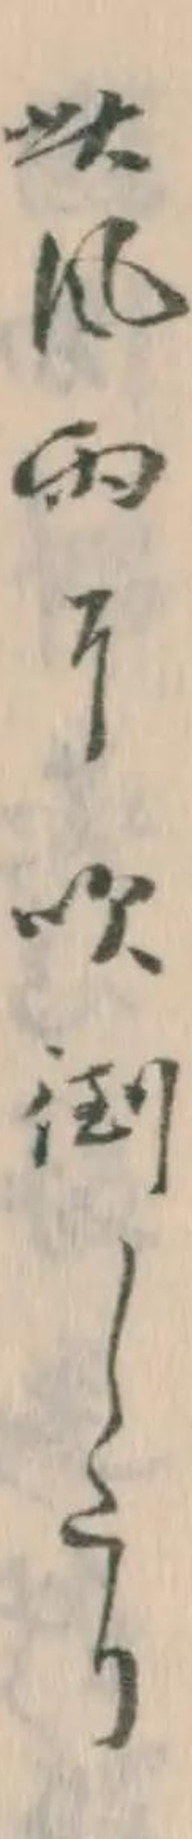此風雨に吹倒したり
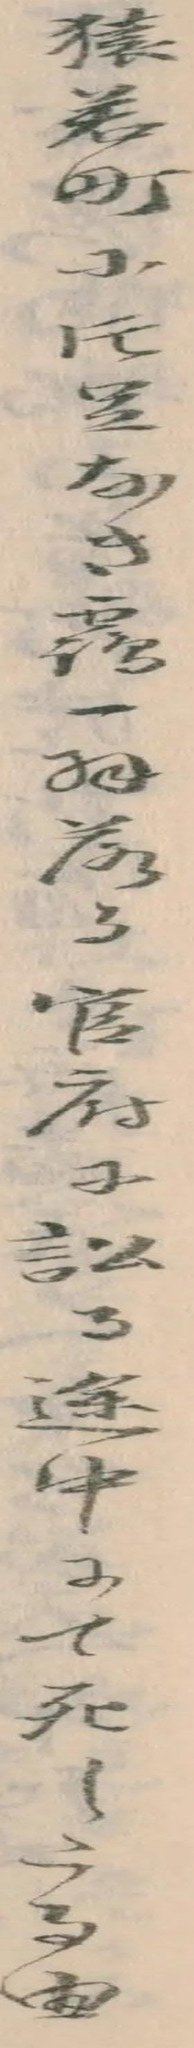猿若町に片足なき鶴一羽落る官府に訟る途中にて死したる由
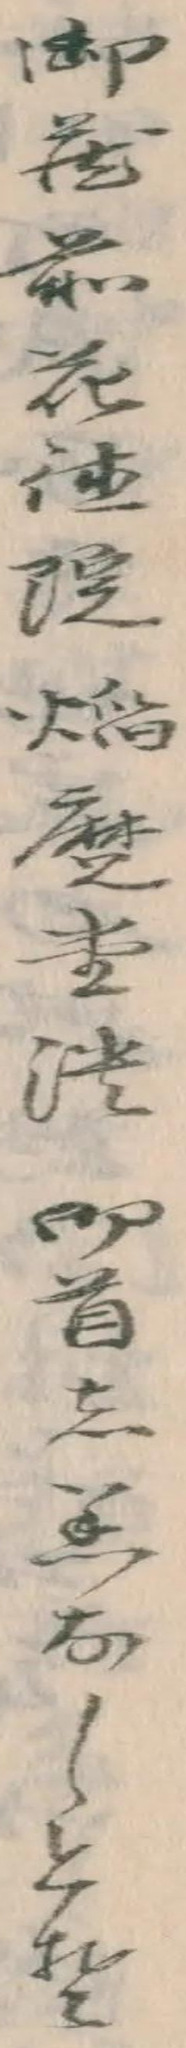御蔵前花徳院焔魔堂潰御首は恙なしとそ
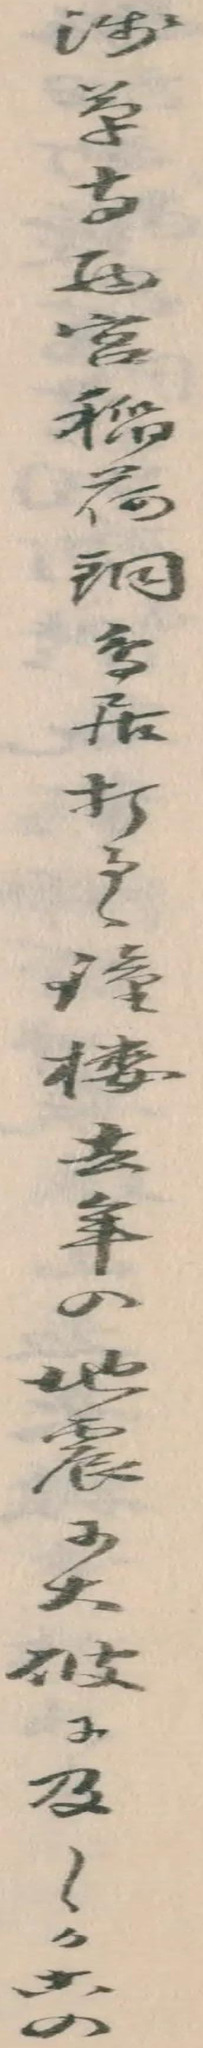浅草寺西宮稲荷銅鳥居折るゝ鐘楼去年の地震に大破に及しかこの
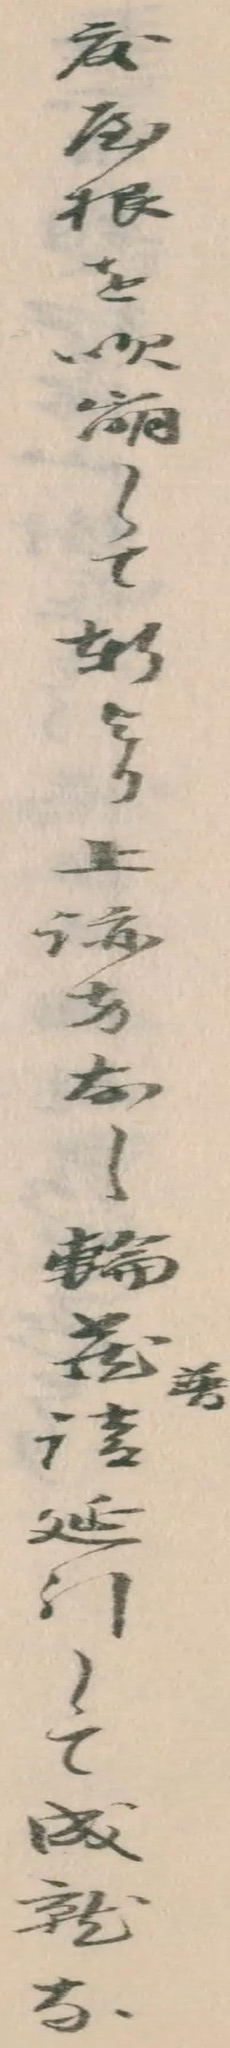度屋根を吹崩して軒より上跡方なし輪蔵普請延引して成就な
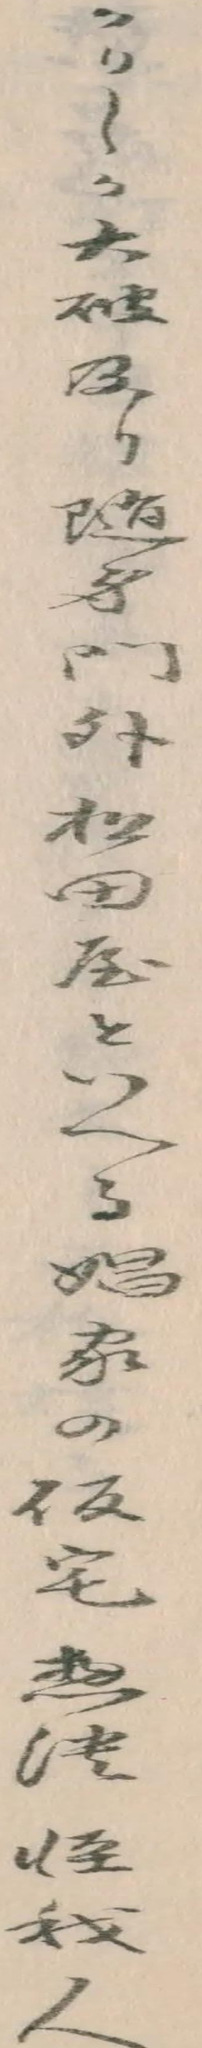かりしか大破及り随身門外松田屋といへる娼家の仮宅惣潰怪我人
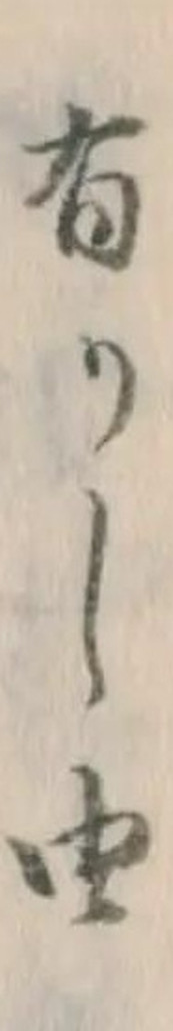有りし由
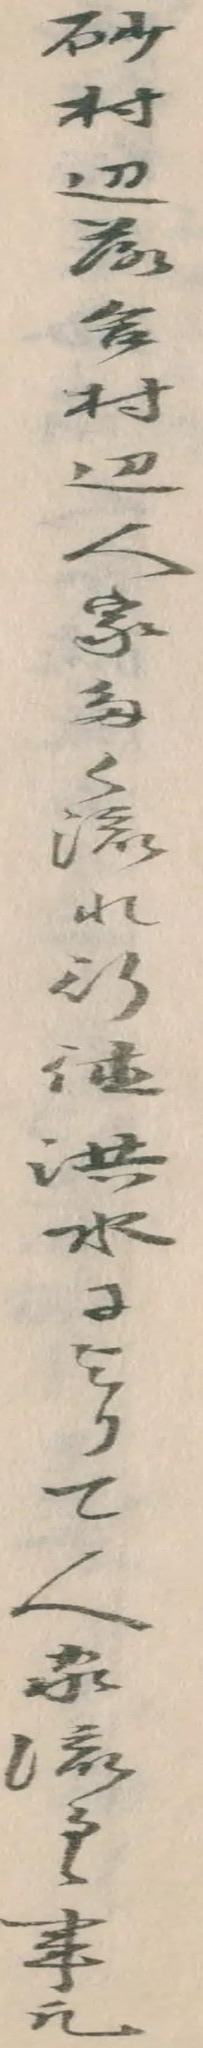砂村辺落合村辺人家多く流れ行徳洪水によりて人家流るゝ事凡
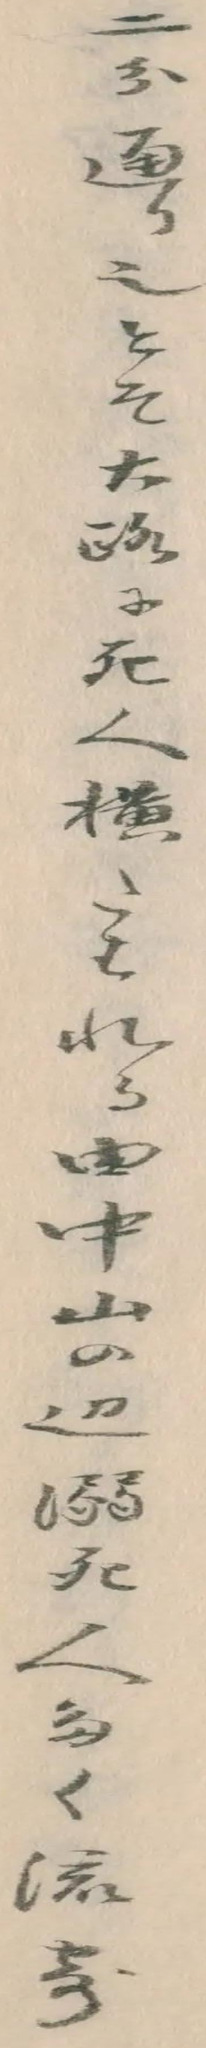二分通り也とそ大路に死人横たはれる由中山の辺溺死人多く流寄

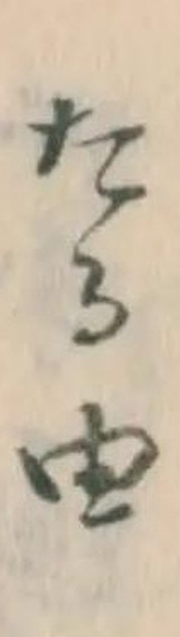たる由
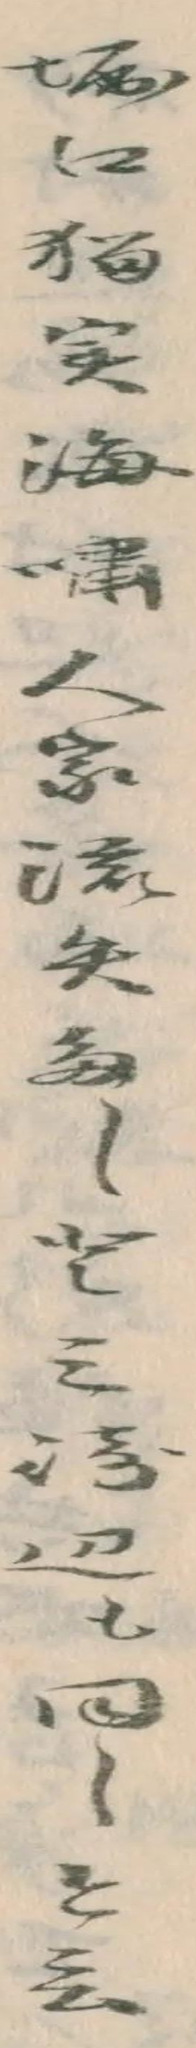堀江猫実海嘯人家流失多しと三崎辺も同しと云
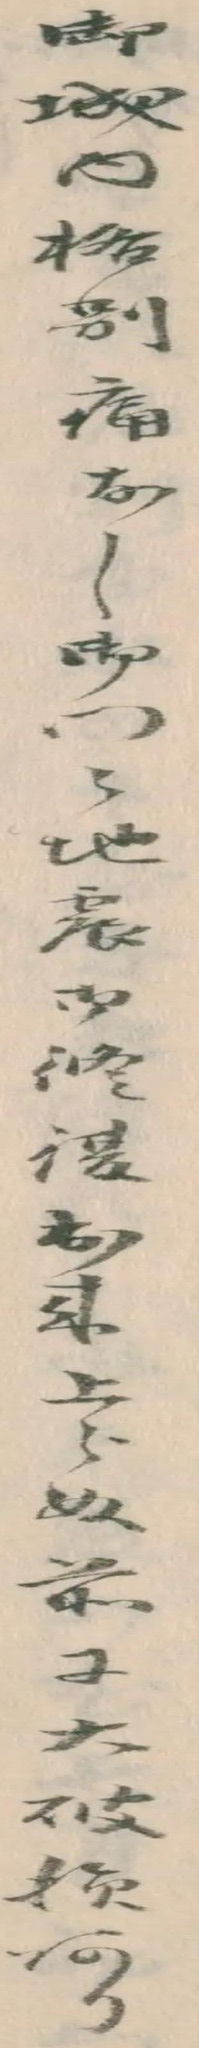御城内格別痛なし御門々地震御修復出来上らぬ前に大破損あり
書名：地災撮要. 巻10(地震之部) 上,下
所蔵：国立国会図書館 National Diet Library, JAPAN
